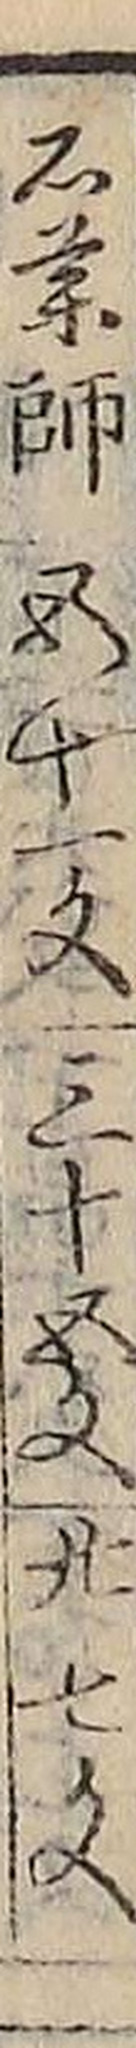石薬師五十一文三十五文廿七文
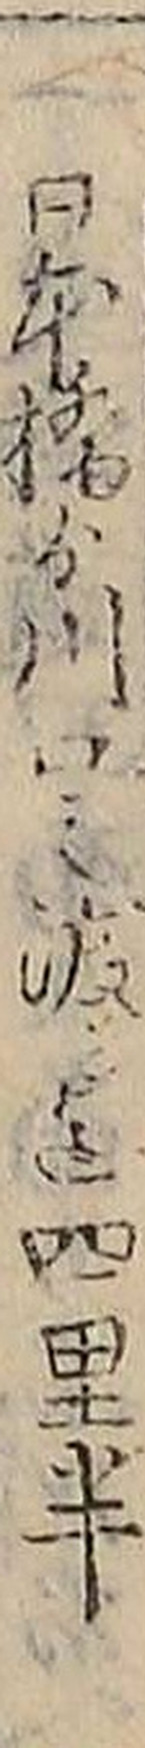日本橋ゟ川口之渡迄四里半
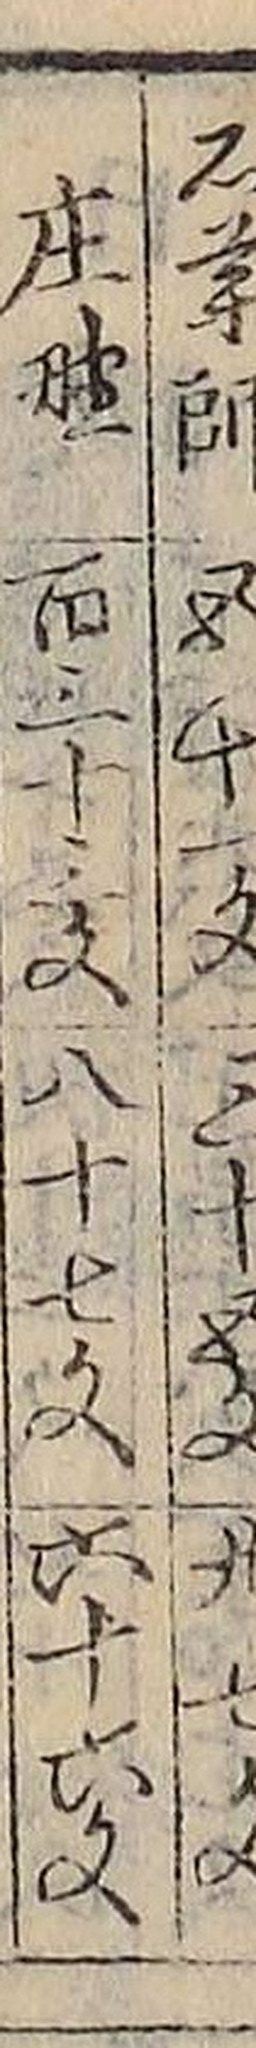庄野百三十三文八十七文六十六文
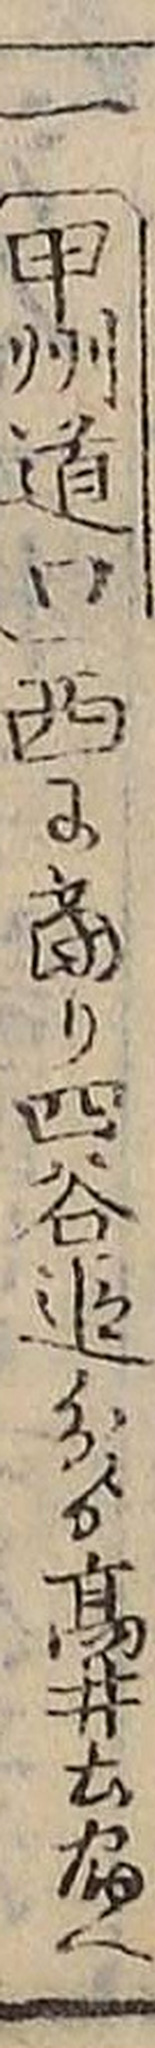一甲州道口西に当り四谷追分ゟ高井土宿へ
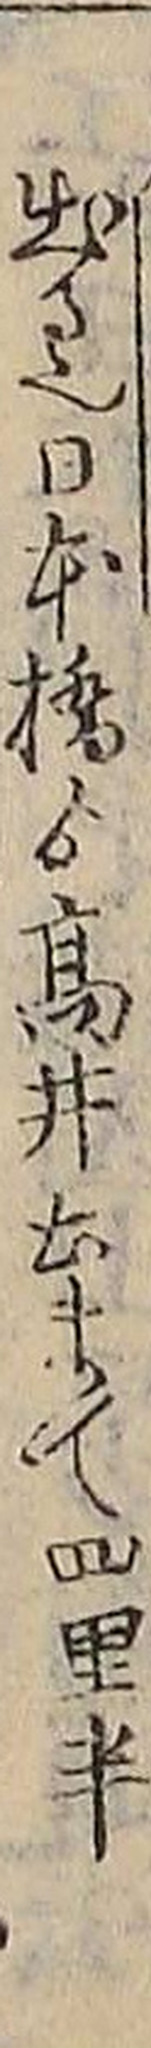出る也日本橋ゟ高井土まて四里半
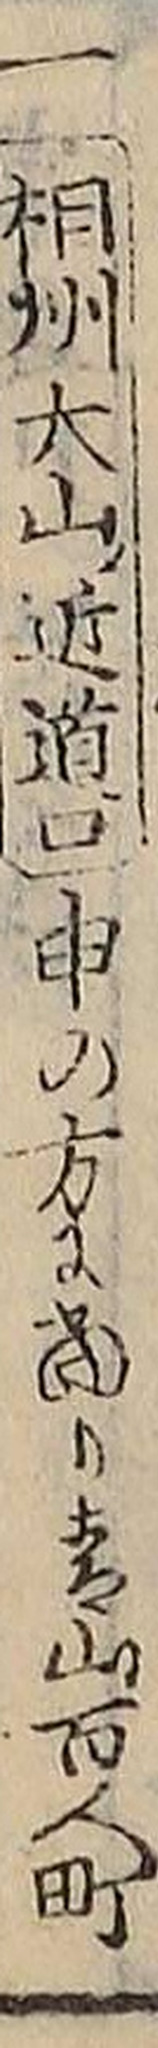一相州大山近道口申の方に当り青山百人町
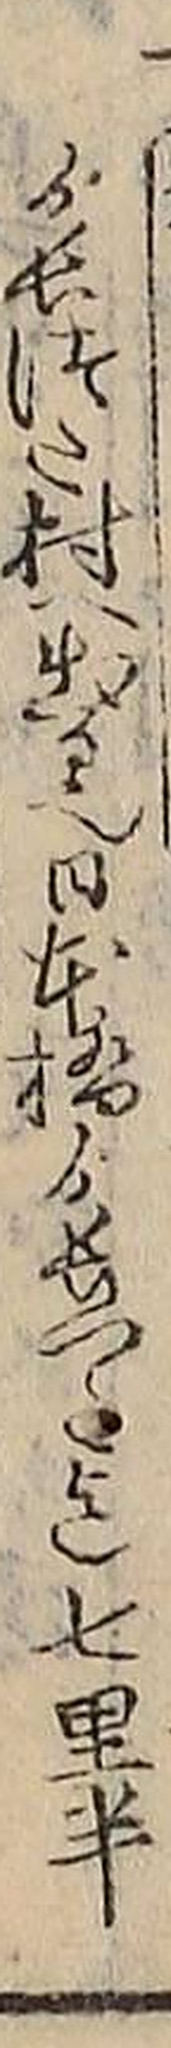ゟ長つた村へ出る也日本橋ゟ長つた迄七里半
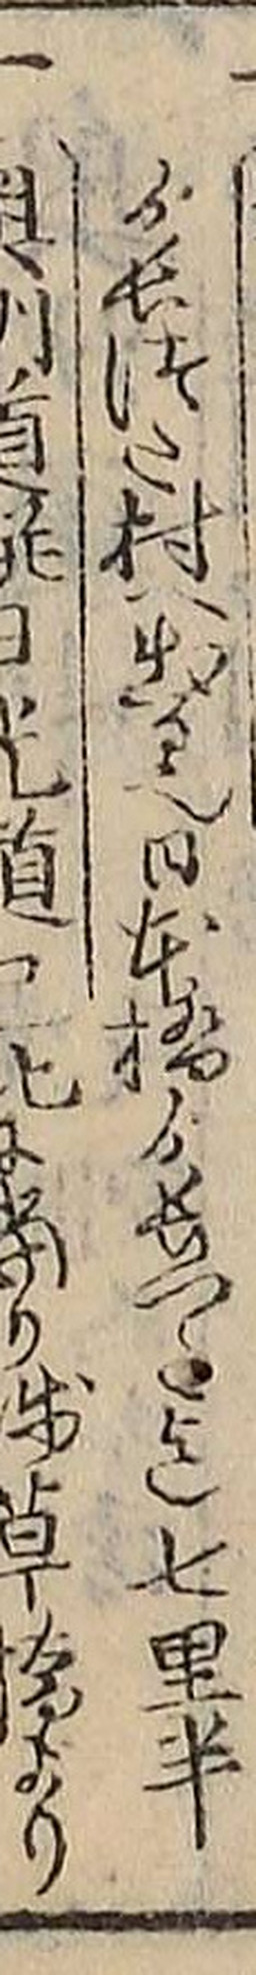一奥州道并日光道口北に当り浅草橋より
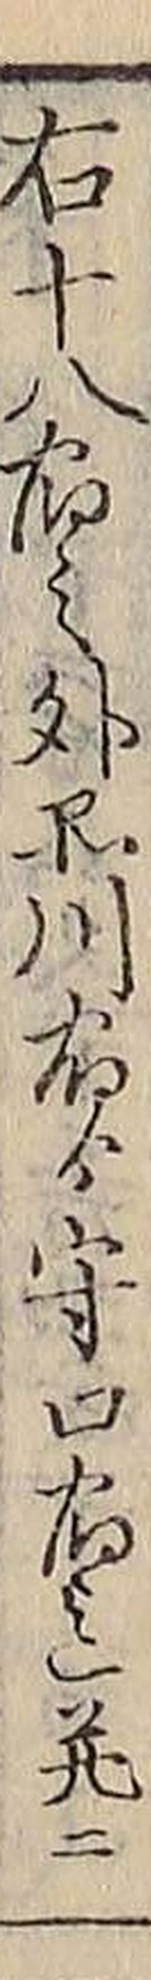右十八宿之外品川宿ゟ守口宿迄并ニ
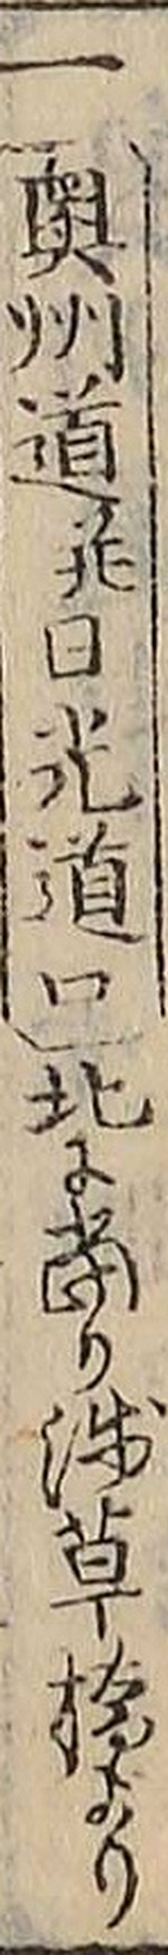一奥州道并日光道口北に当り浅草橋より
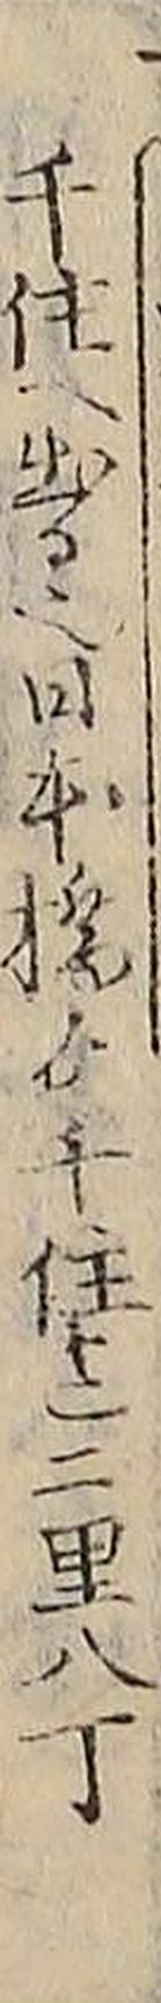千住へ出る也日本橋ゟ千住迄二里八丁
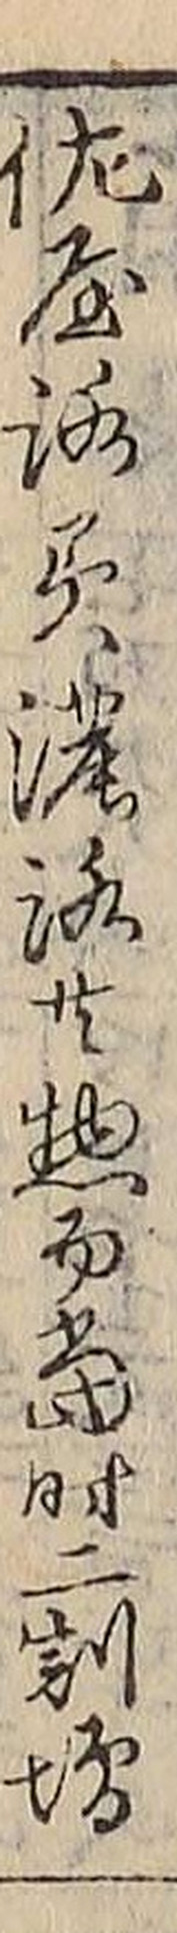佐屋路美濃路共惣而当時二割増
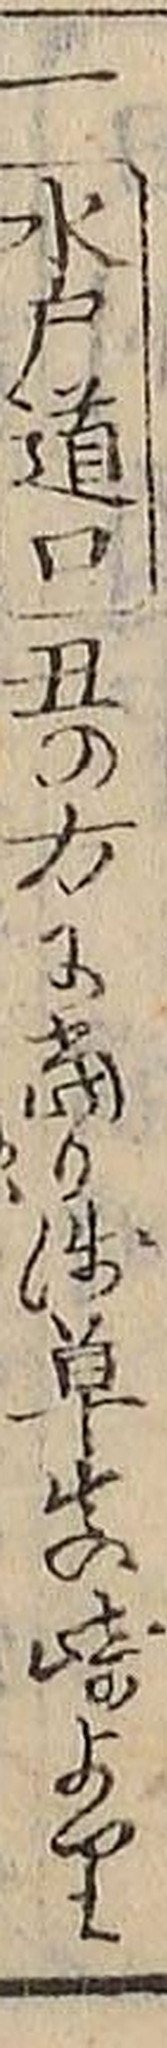一水戸道口丑の方に当り浅草真崎より
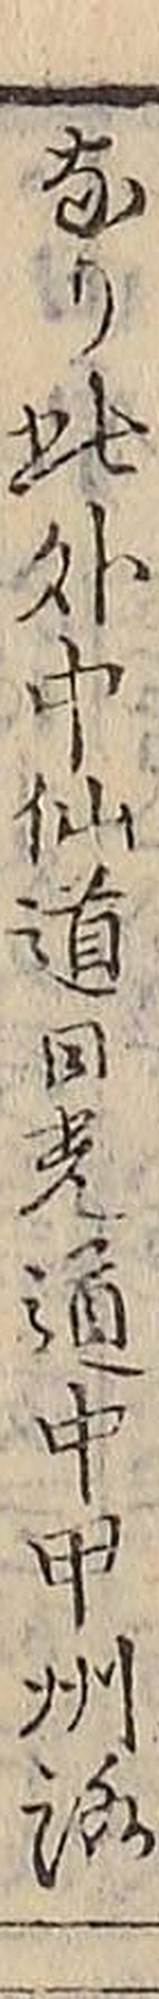なり此外中仙道日光道中甲州路
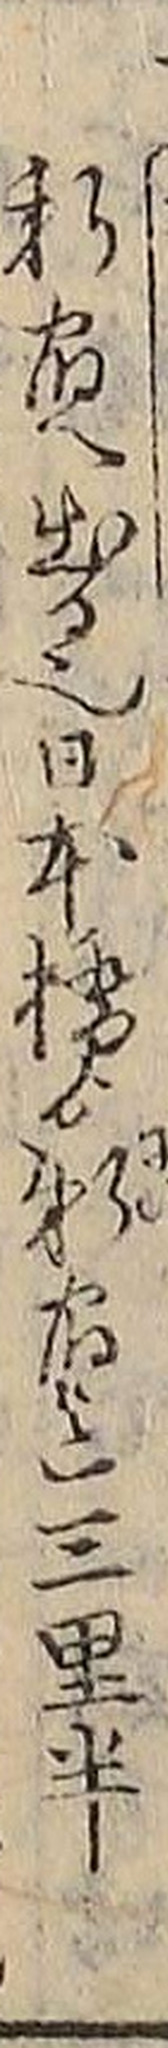新宿へ出る也日本橋ゟ新宿迄三里半
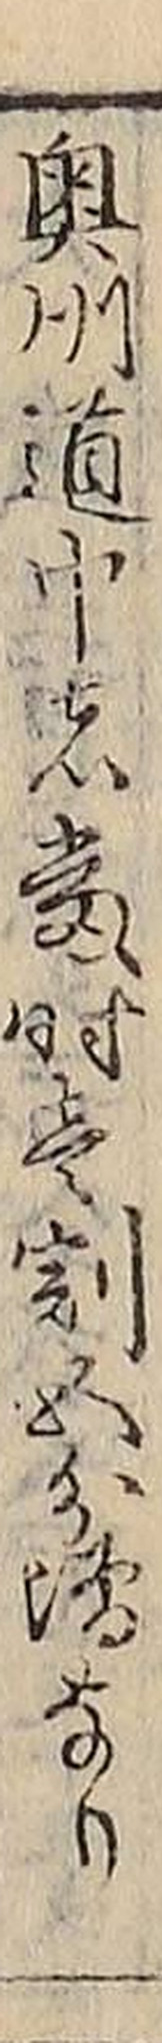奥州道中は当時壱割五分増なり
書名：旅行用心集
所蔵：神戸大学附属図書館 国文学研究資料館
